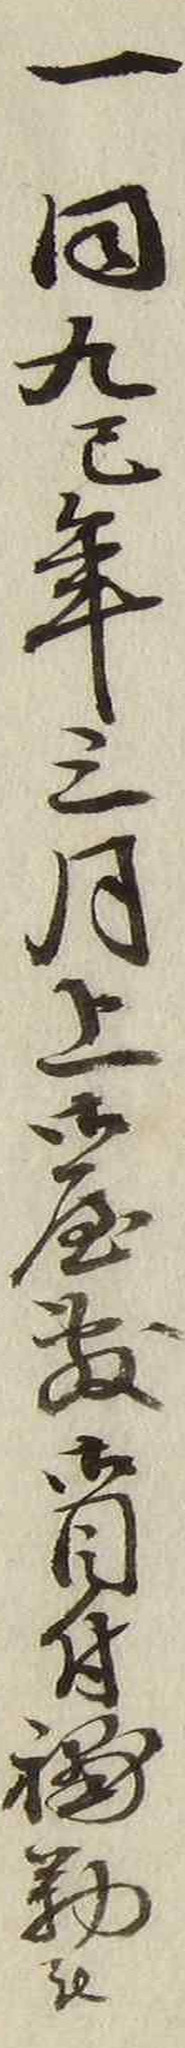一同九巳年三月上御屋敷御目付補勤被
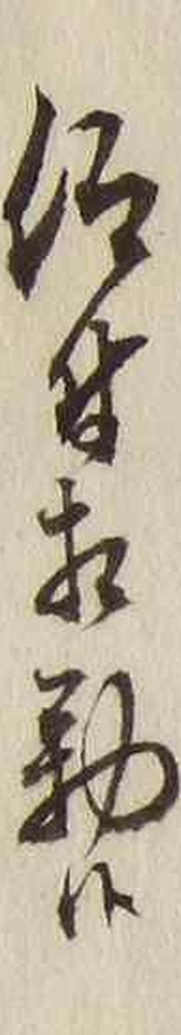仰付相勤候
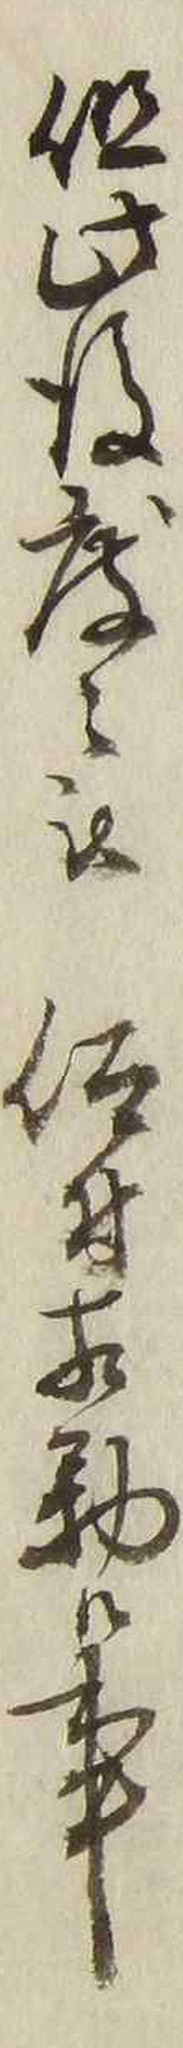但此後度々被仰付相勤候事

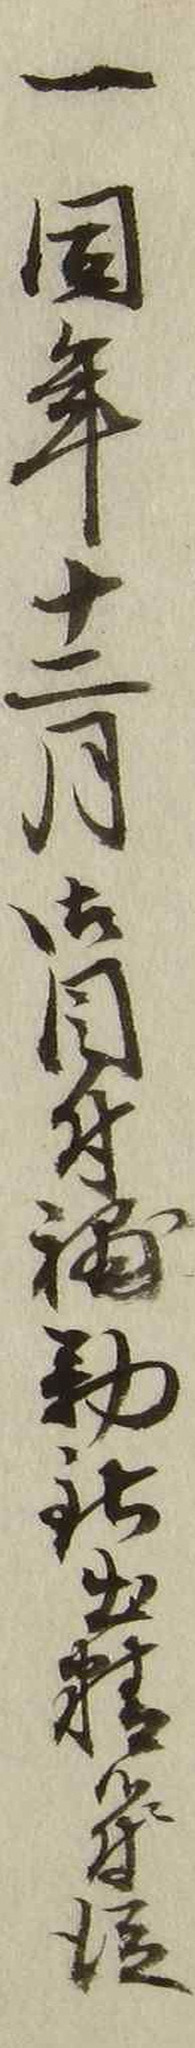一同年十二月御目付補勤致出精候ニ付従
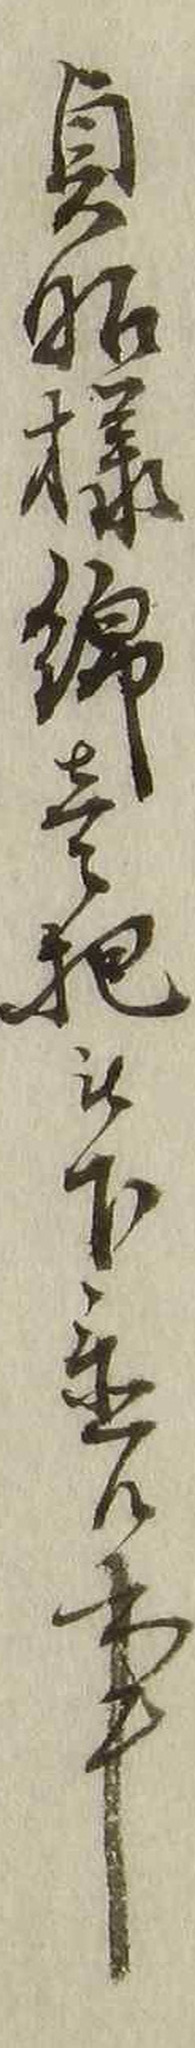貞昭様綿壱把被下置候事
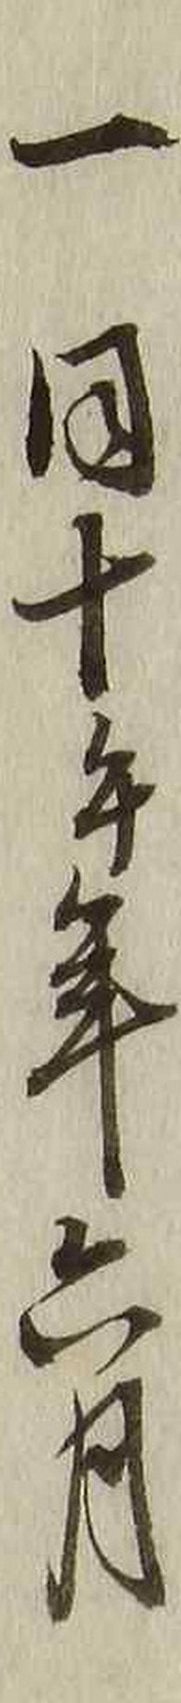一同十午年六月
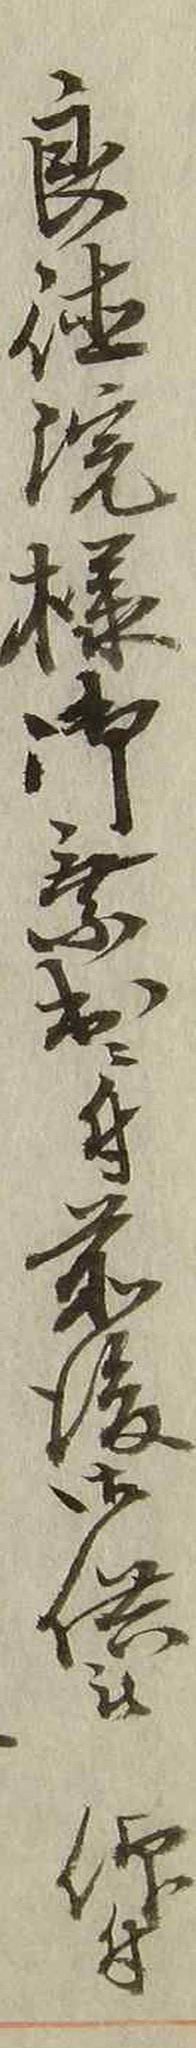良徳院様御乗出ニ付前後御供被仰付
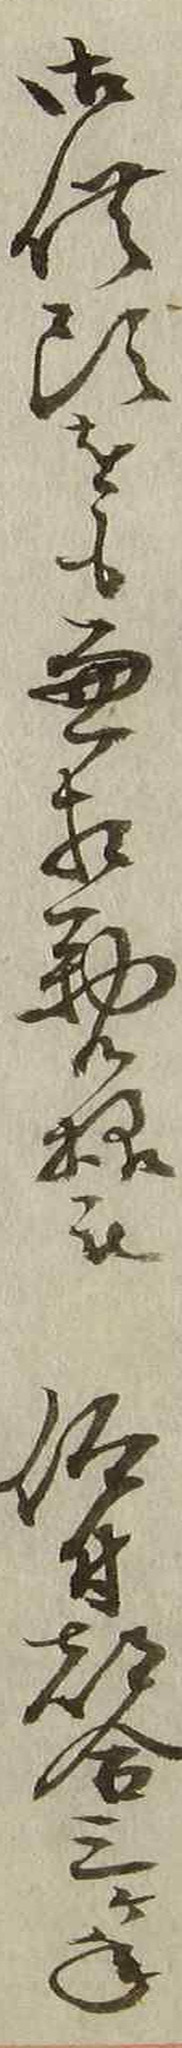御供頭をも兼相勤候様被仰付都合三ケ年
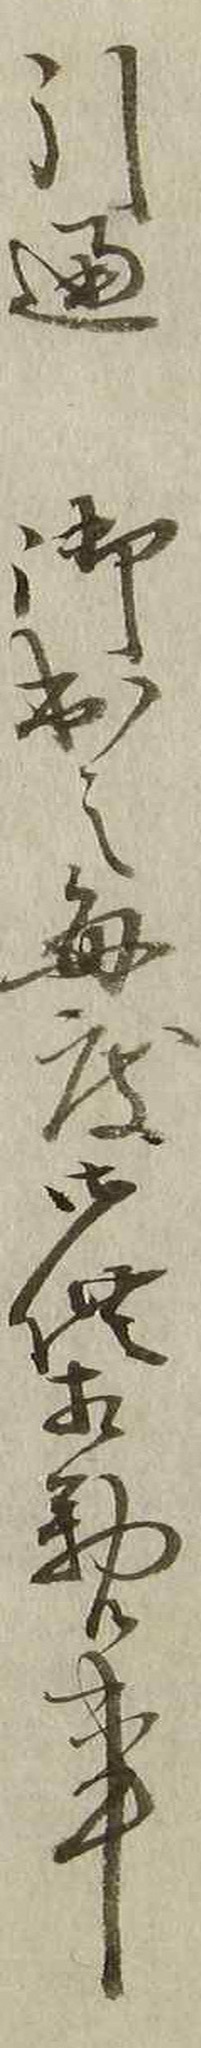引通御出之毎度御供相勤候事
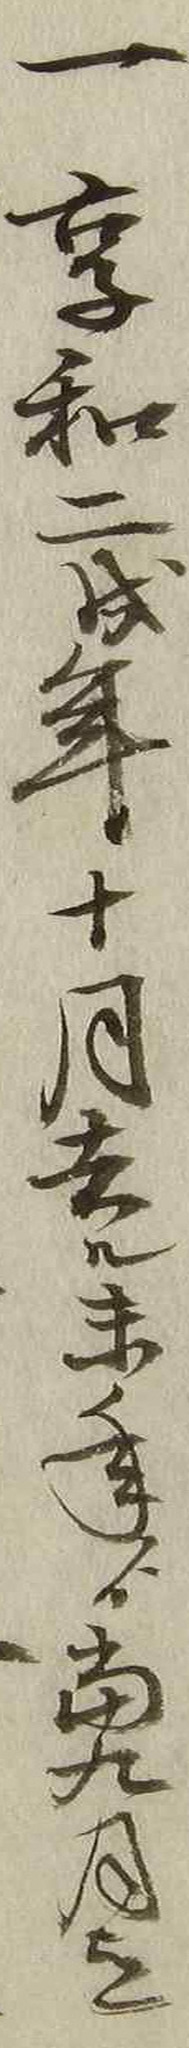一享和二戌年十月去ル未年ゟ当九月迄
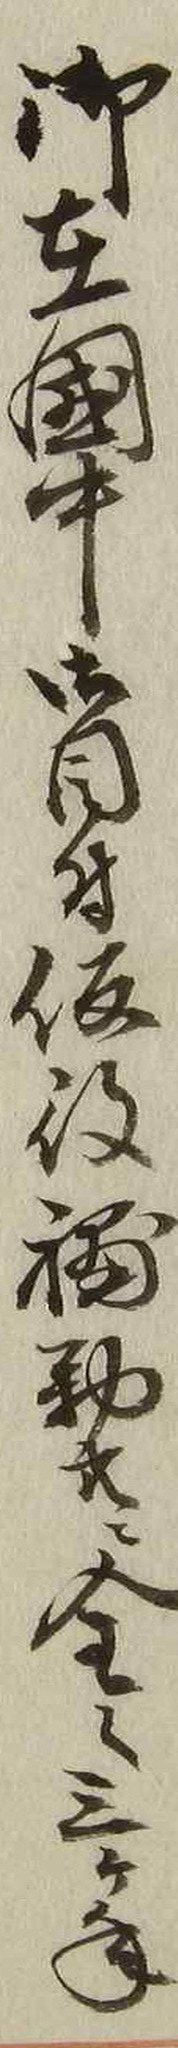御在国中御目付仮役補勤共ニ全々三ケ年
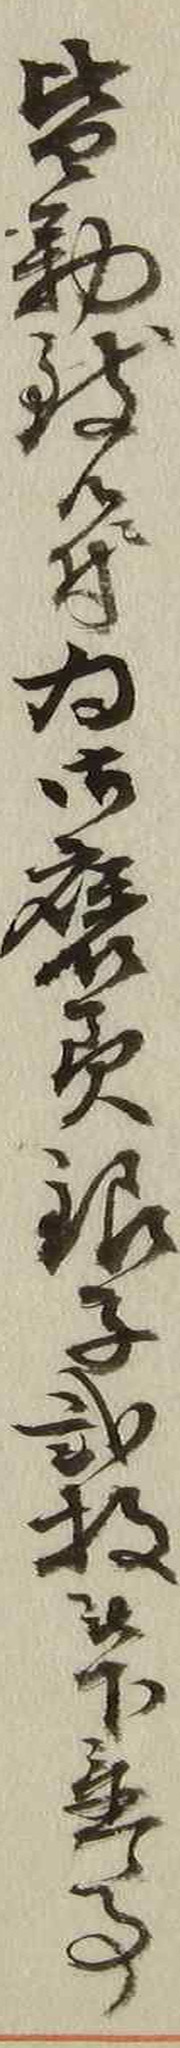皆勤致候ニ付為御褒美銀子弐枚被下置候事
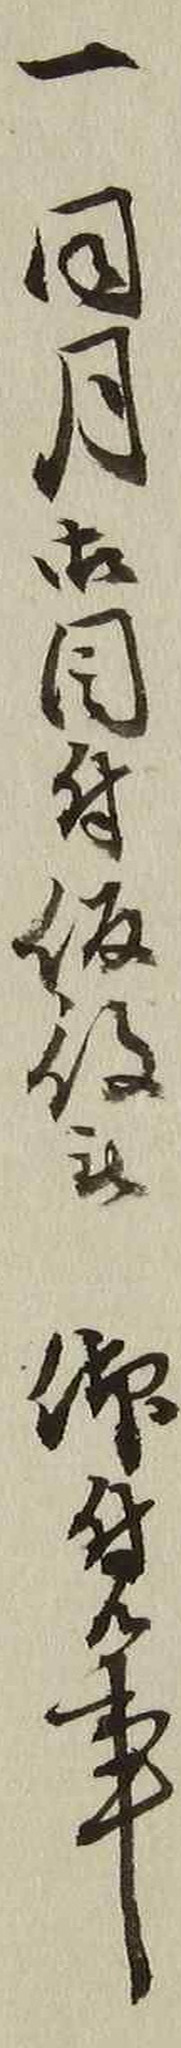一同月御目付仮役被仰付候事
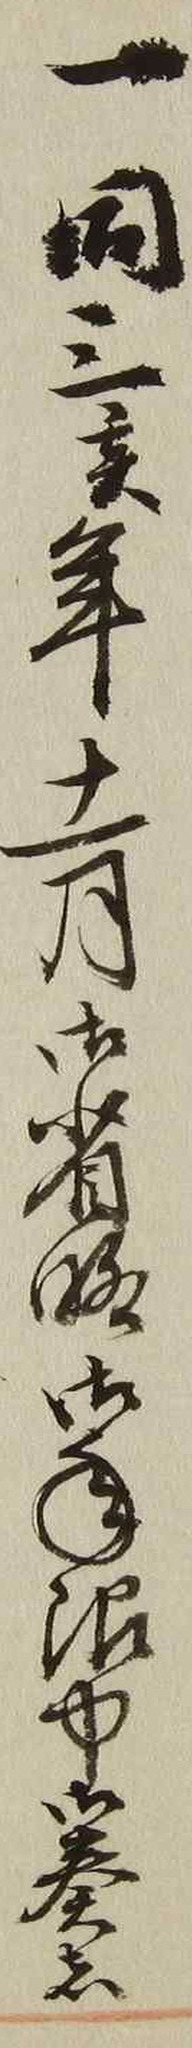一同三亥年十一月御省略御年限中御奏者
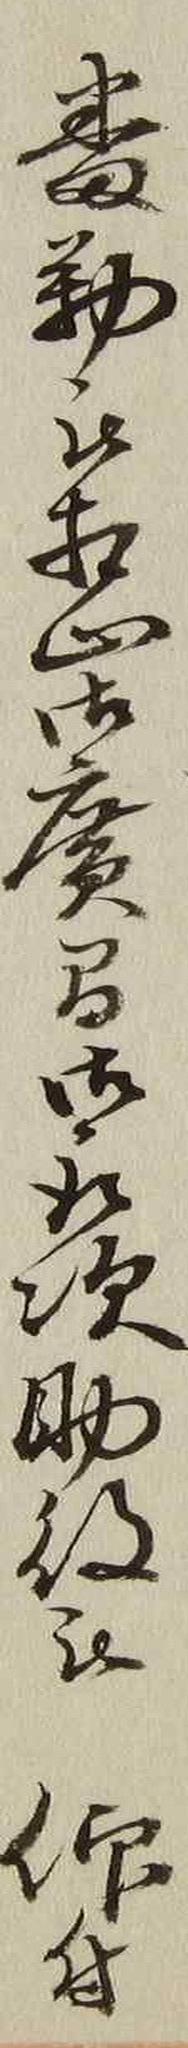番勤被相止御広間御取次助役被仰付
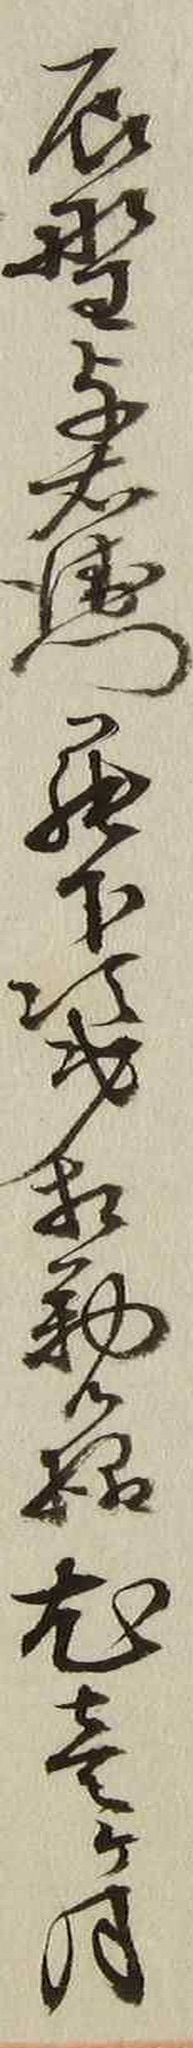辰野与右衛門罷下次第相勤候様尤壱ケ月
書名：諸士系譜　巻之23　い之部23
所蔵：会津若松市立会津図書館
